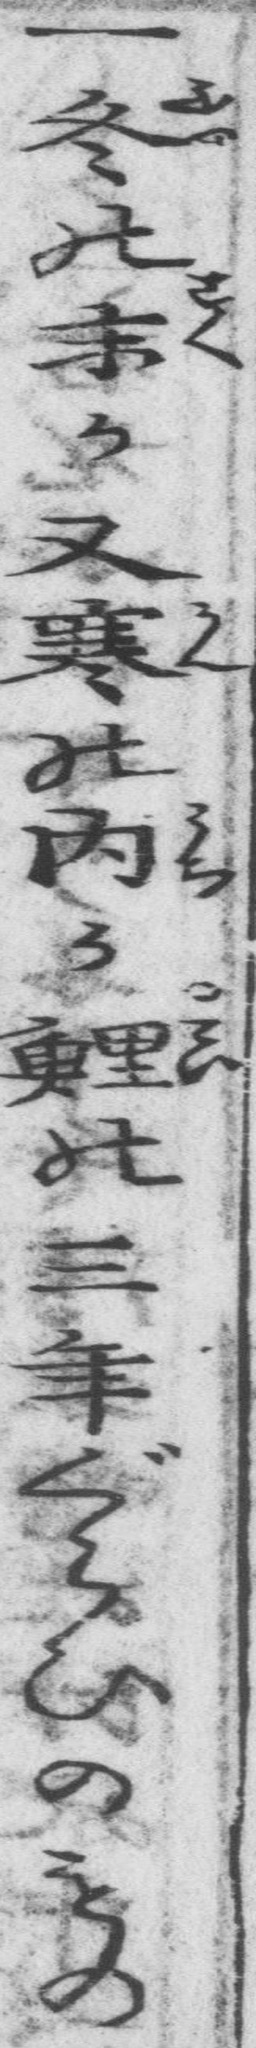一冬の末か又寒の内か。鯉の三年ぐらひのもの
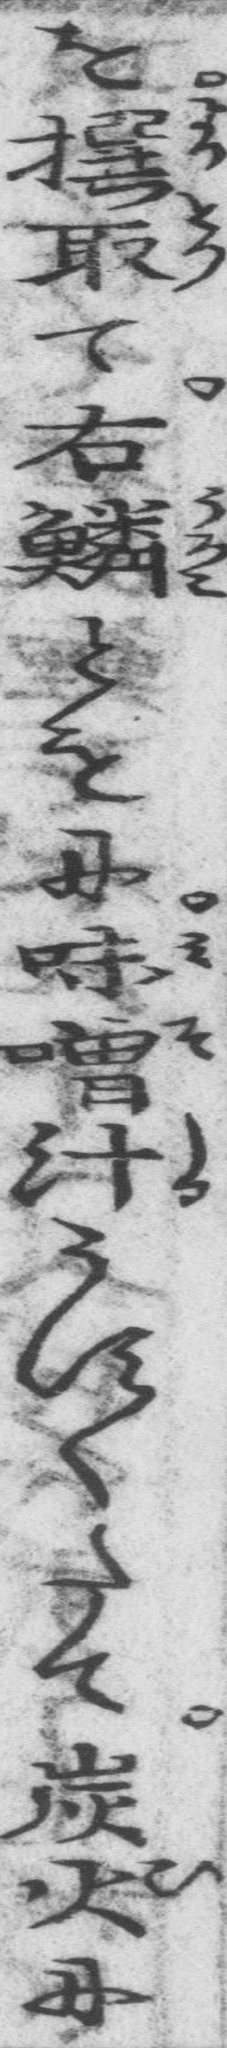を。撰取て。右鱗ともに。味噌汁うすくたて。炭火に
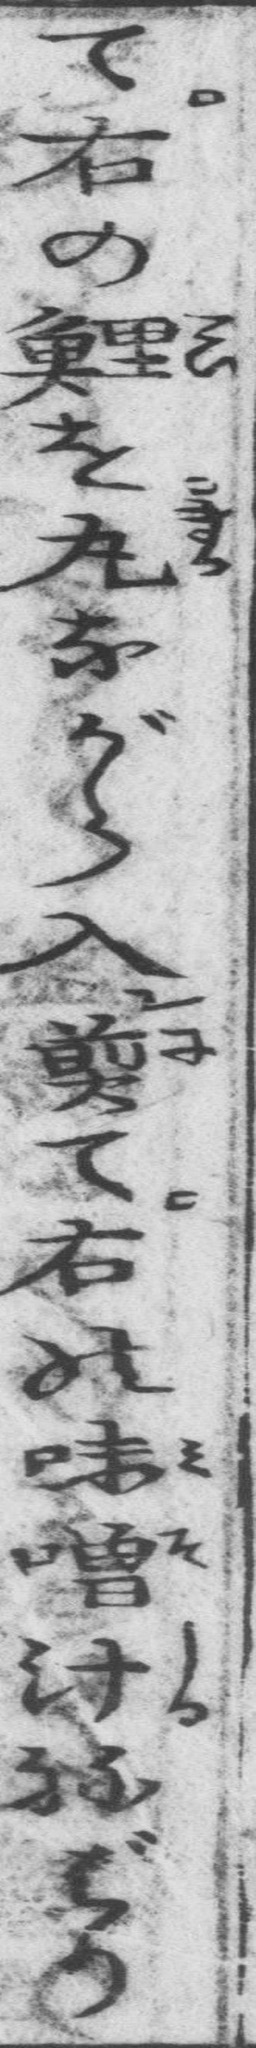て。右の鯉を丸ながら入れ煎て。右の味噌汁ねばり
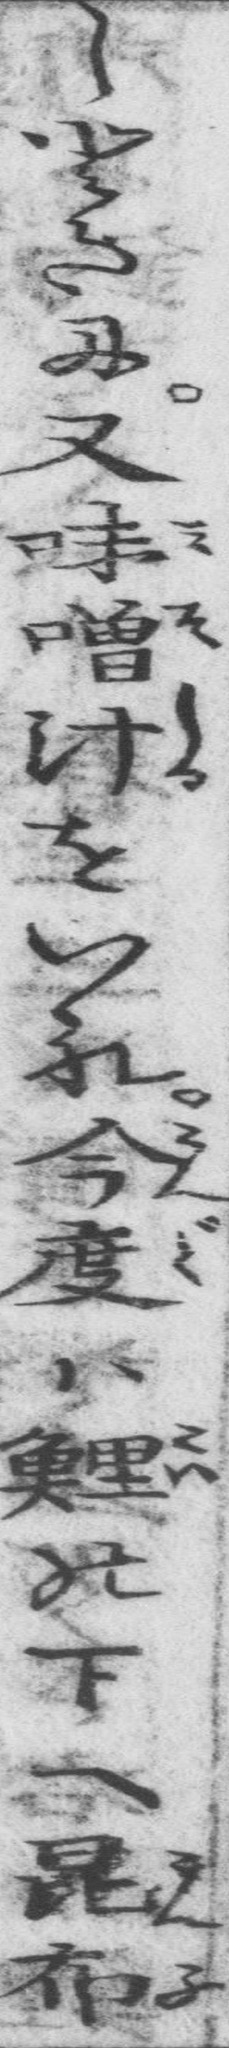しときに。又味噌汁をいれ。今度は鯉の下へ昆布
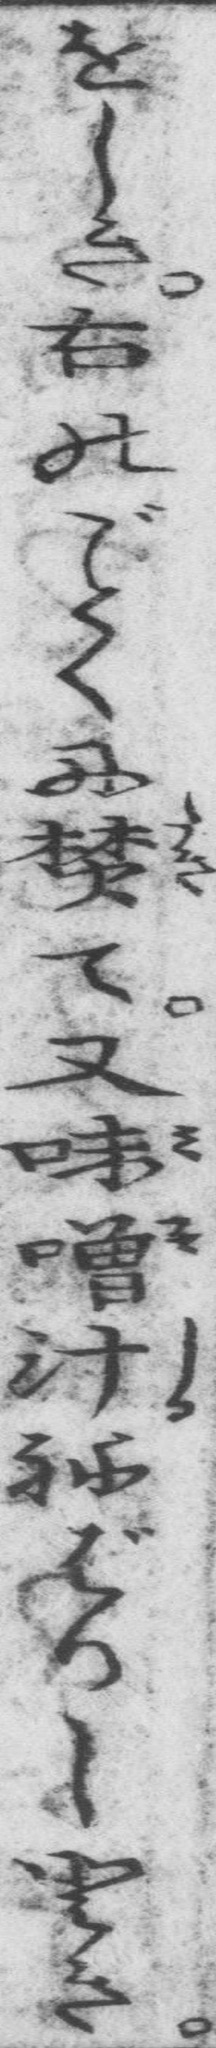をしき。右のごとくに焚て。又味噌汁ねばりしとき。
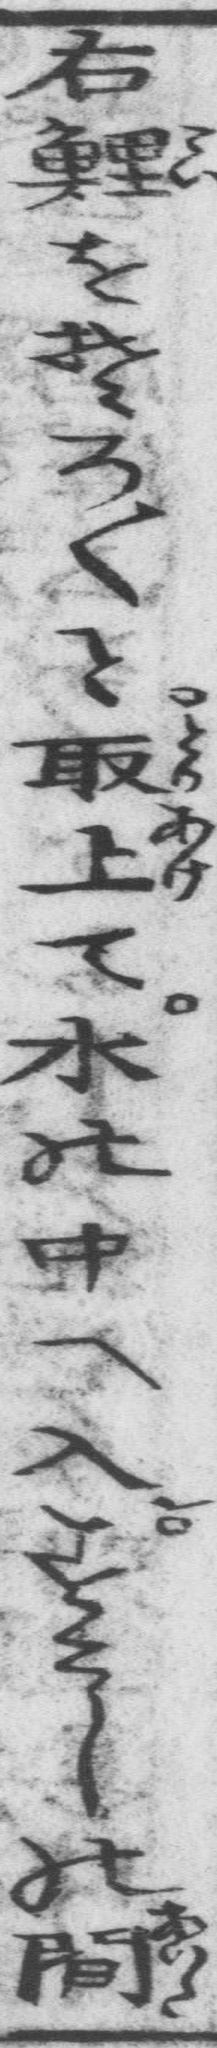右鯉をそろ〳〵と。取上て。水の中へ入れ。すこしの間
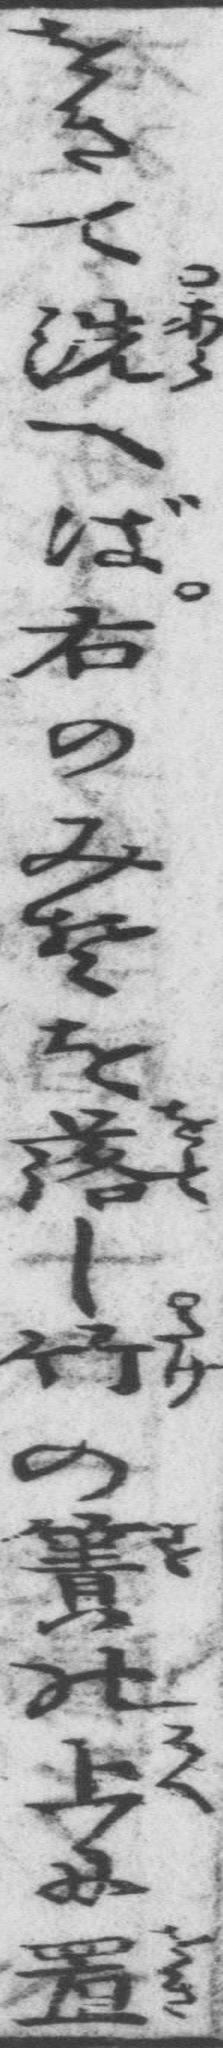をきて。洗へば。右のみそを落し。竹の簀の上に置
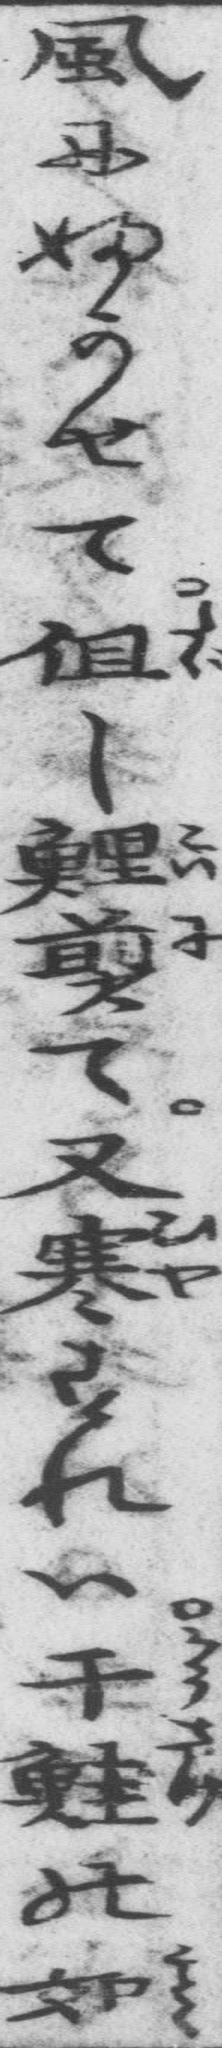風にふかせて。但し鯉煎て。又寒すれは。干鮭の如

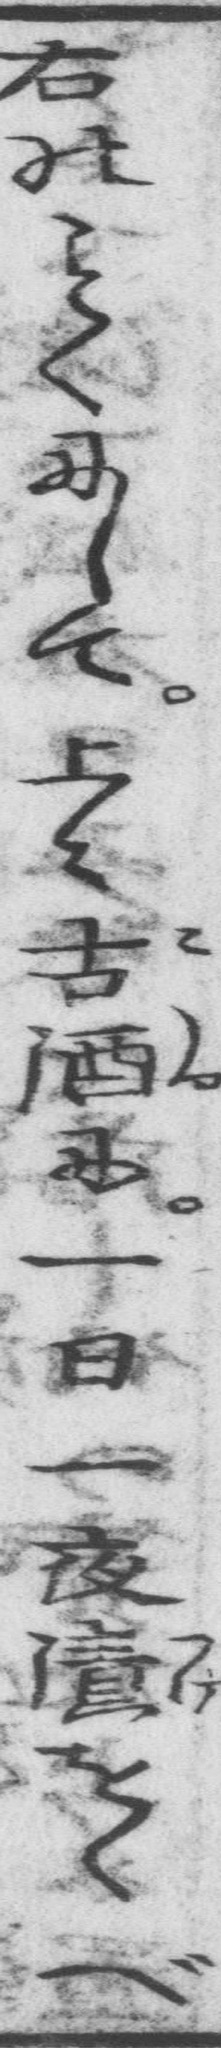右のことくにして。上々古酒に。一日一夜漬をくべ
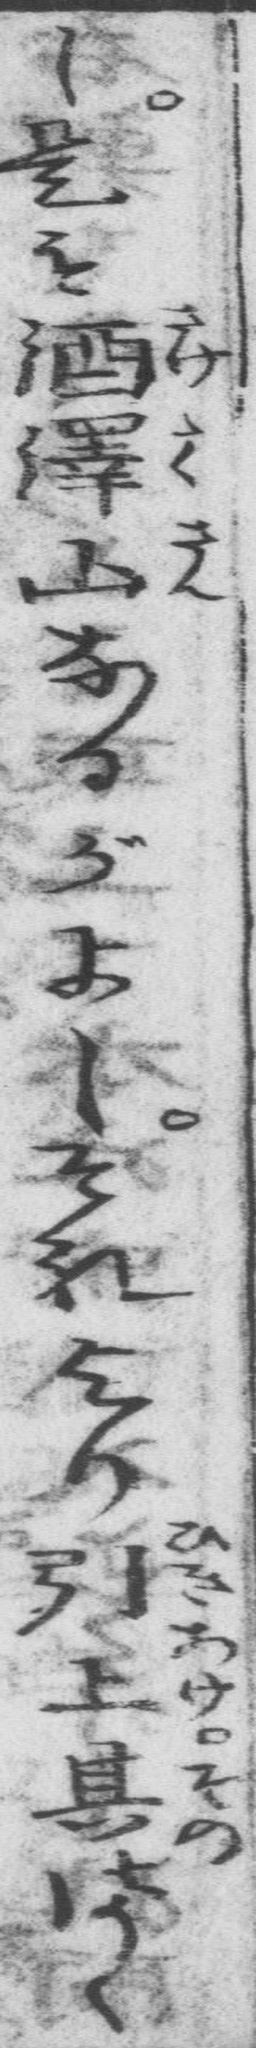し。是も酒沢山なるがよし。それより。引上。其まゝ
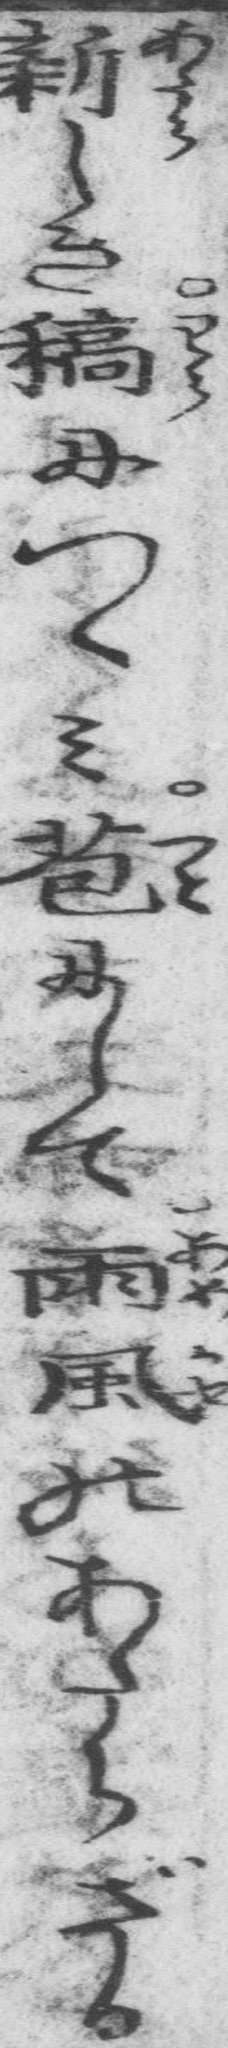新しき。稿につゝみ。苞にして。雨風のあたらざる
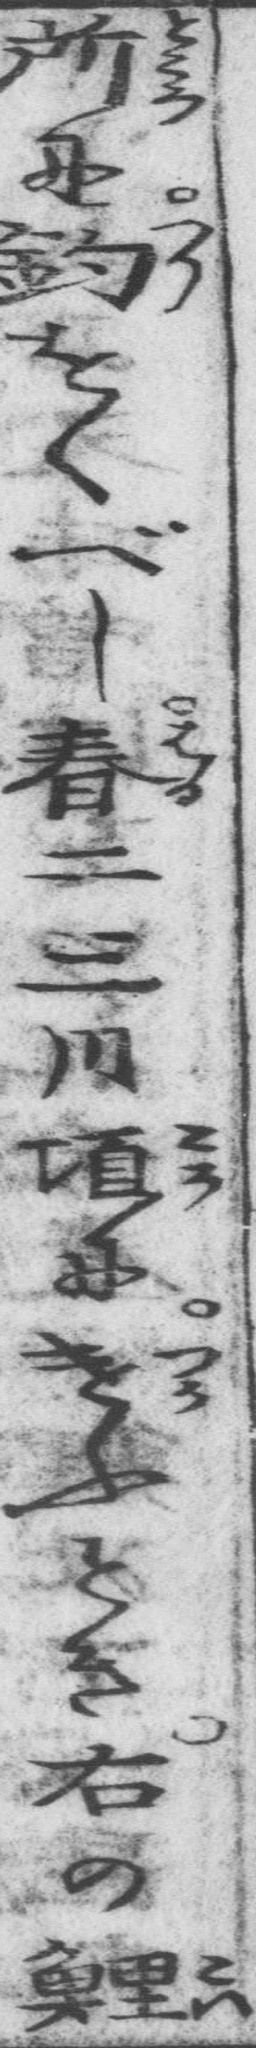所に。釣をくべし。春二三月頃に。遣ふとき。右の鯉
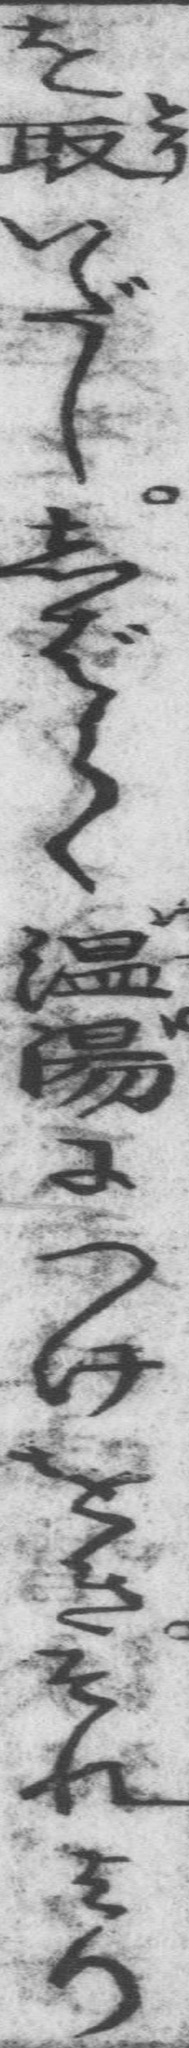を取いだし。しばらく温湯につけをき。それより
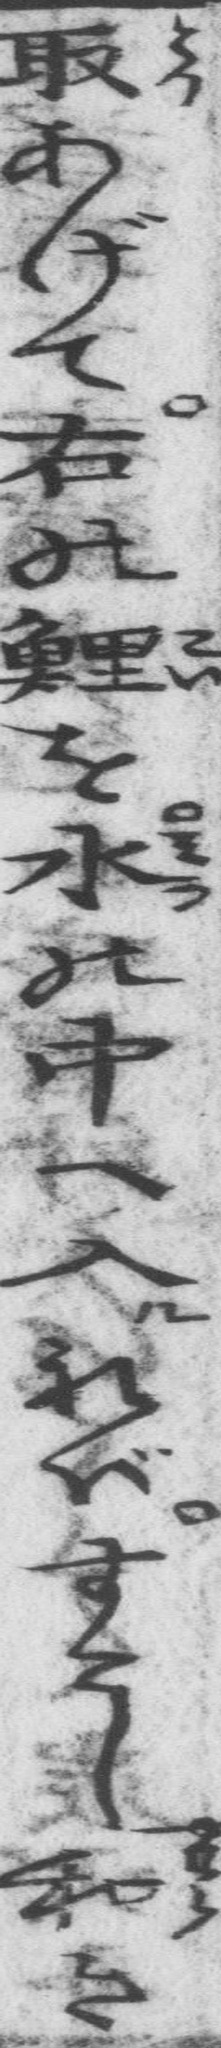取あげて。右の鯉を。水の中へ入るれば。すこし和き
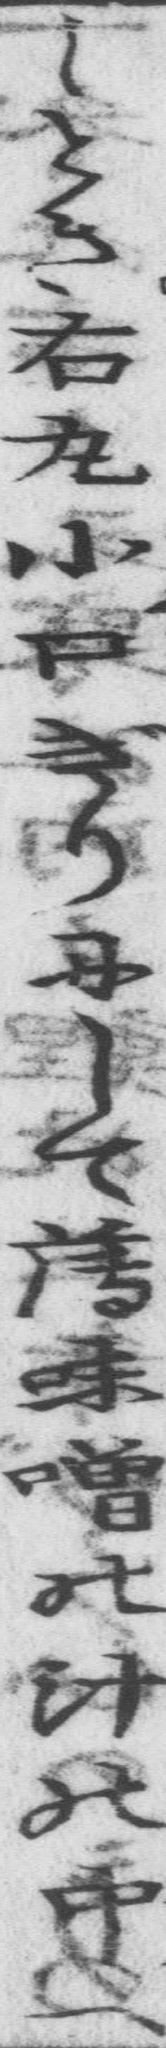しとき。右丸小口ぎりにして。薄味噌の汁の中へ。
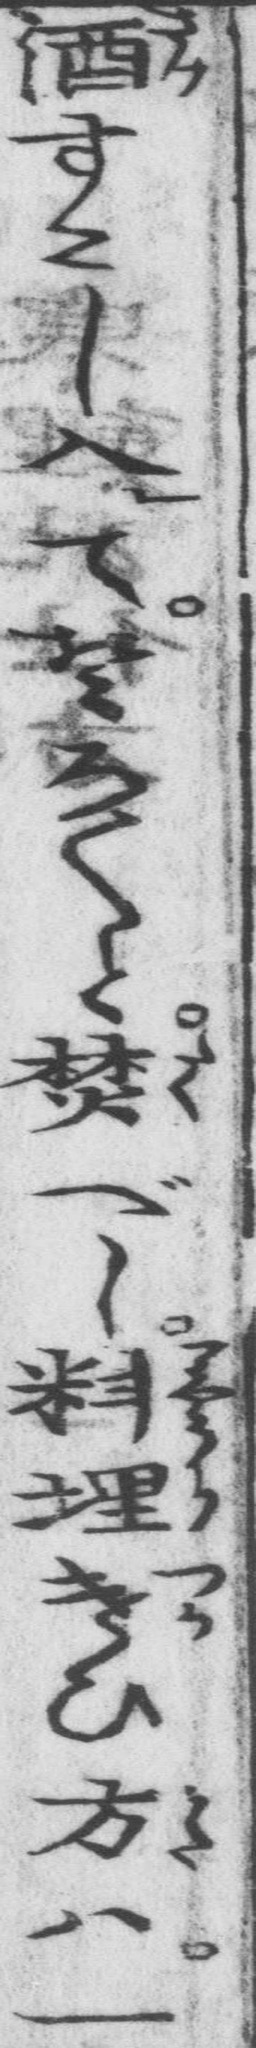酒すこし入れて。そろ〳〵と。焚べし。料理遣ひ方は。一
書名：萬寳料理秘密箱
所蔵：大阪府立大学学術情報センター 国文学研究資料館
